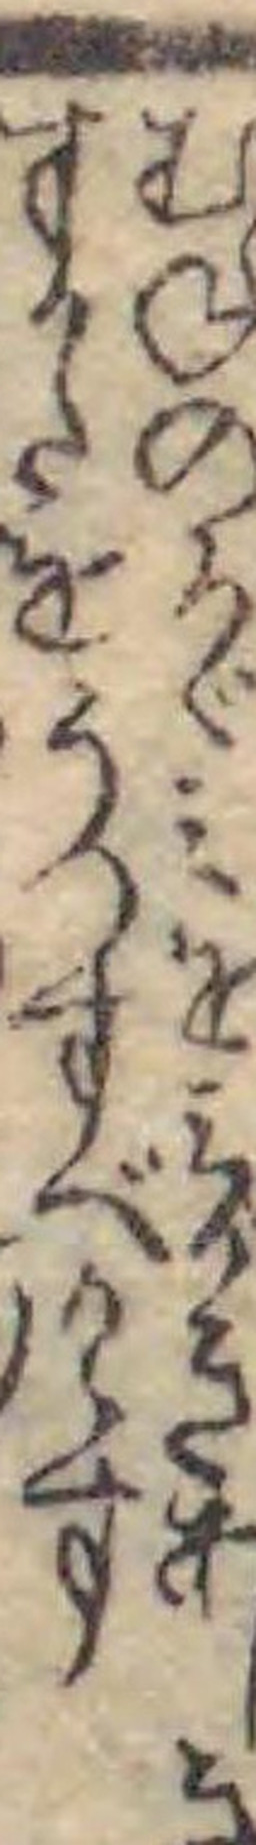すかたをうつすべからす
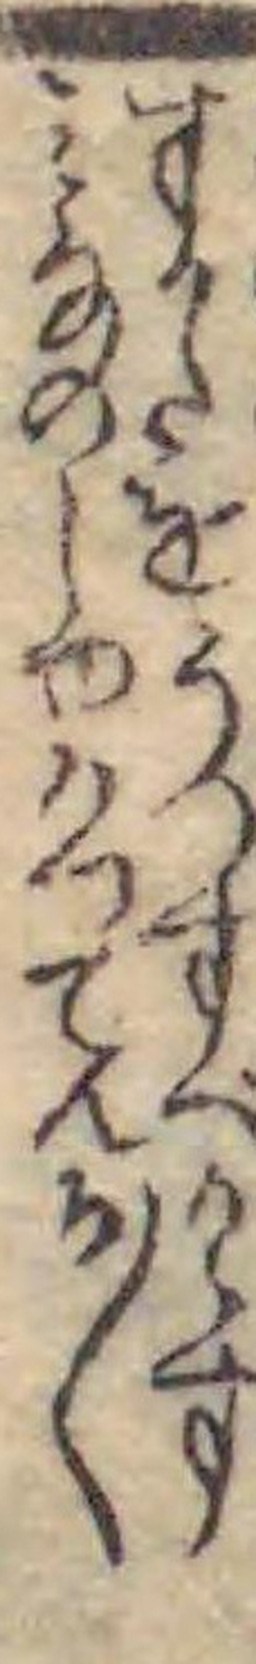みなのしゆかつてんか〳〵
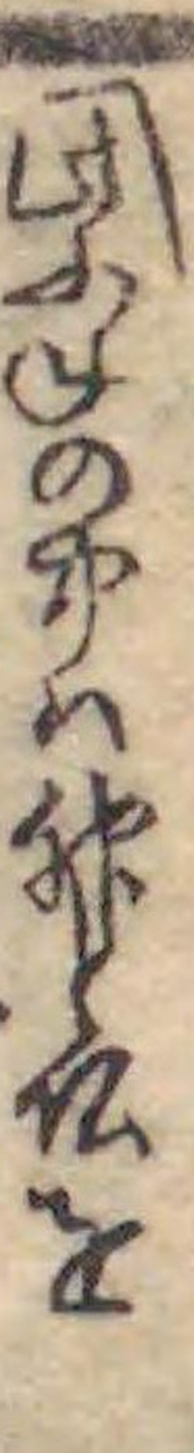〽此ふねの中は神仏を
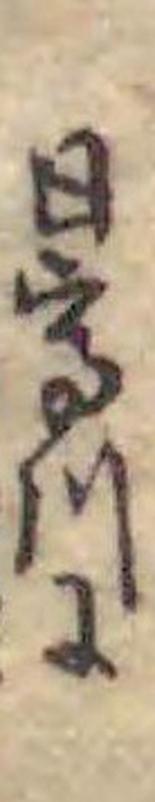日高川に
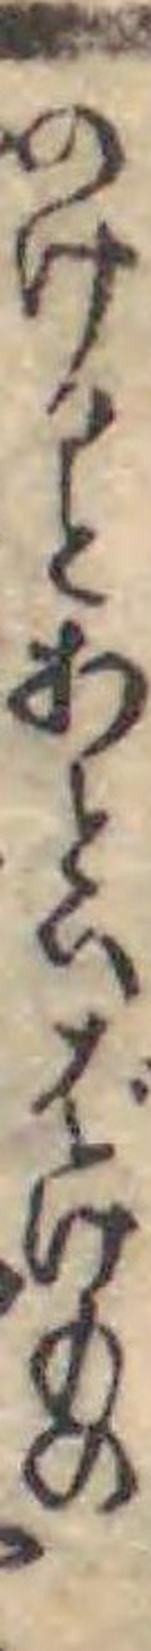のけるとあとはばけものの
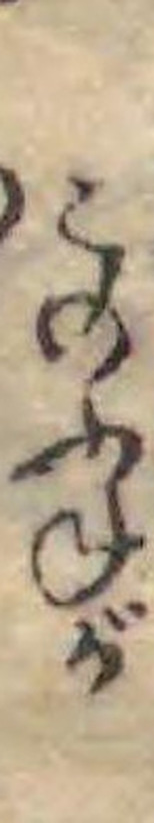このふねが
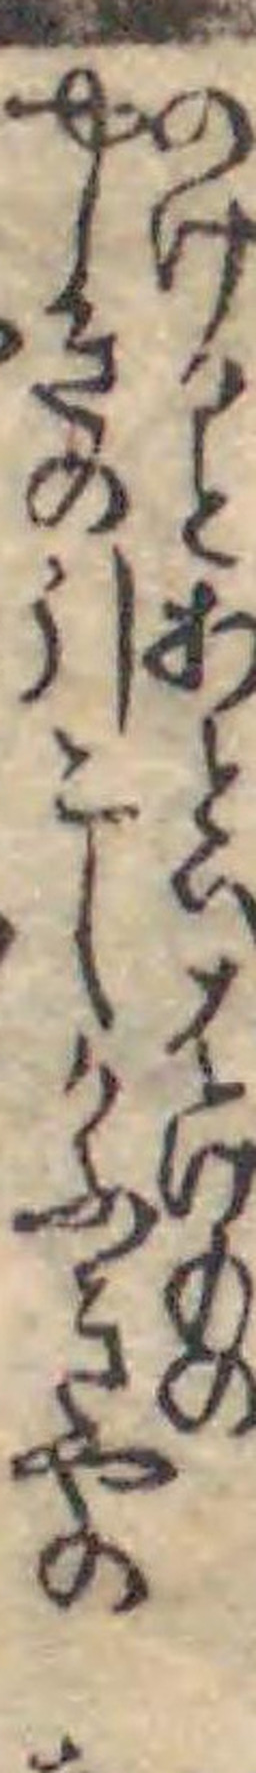やしきの引こしかふきやの
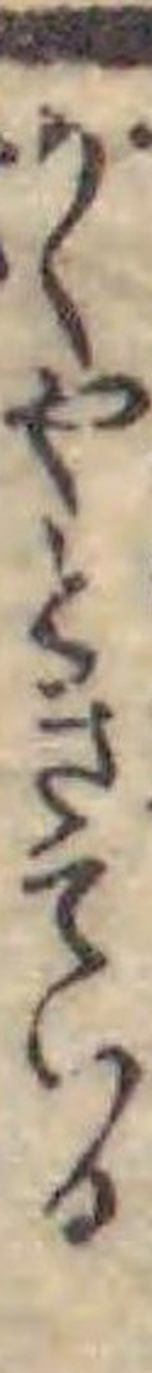かくやときている
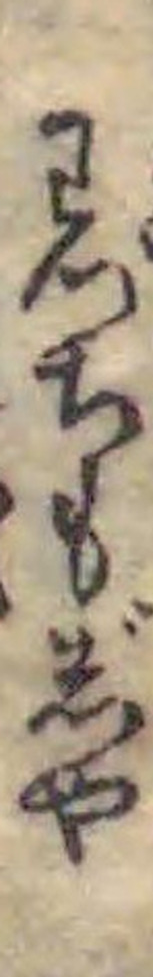わつちもじや
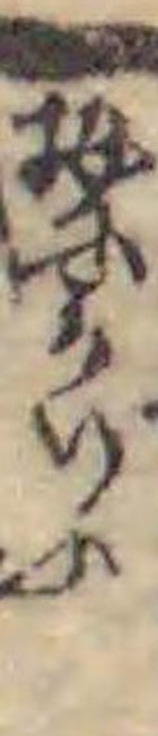おにかいふ
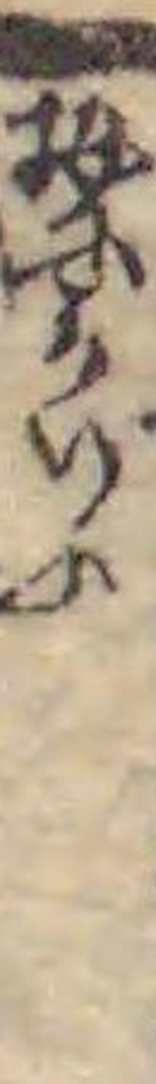おにかいふ
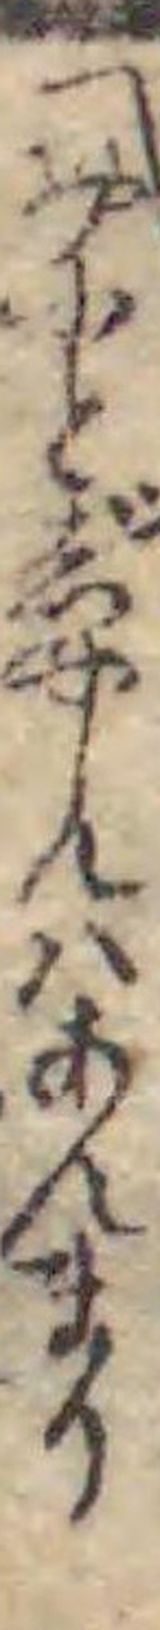〽おにとじやんはあんまり
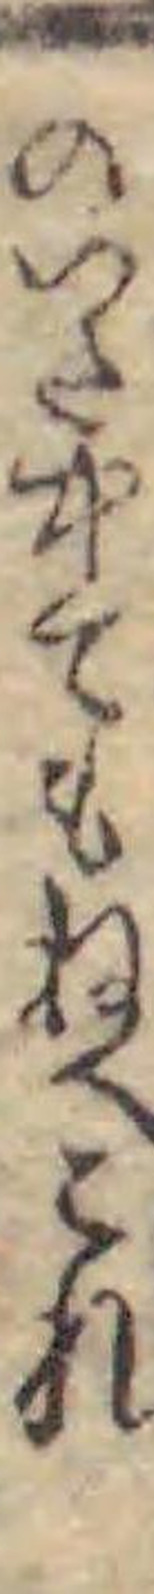のいた中てもねへこれ
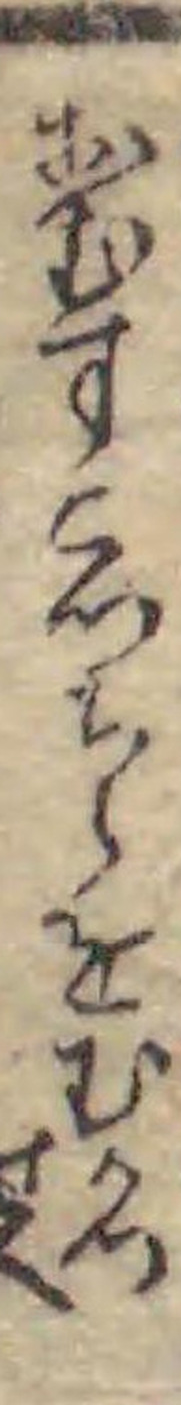おむすこつちらをむかつ
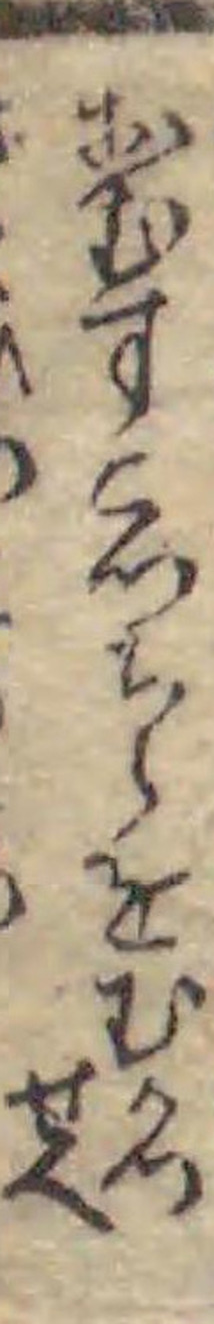おむすこつちらをむかつ
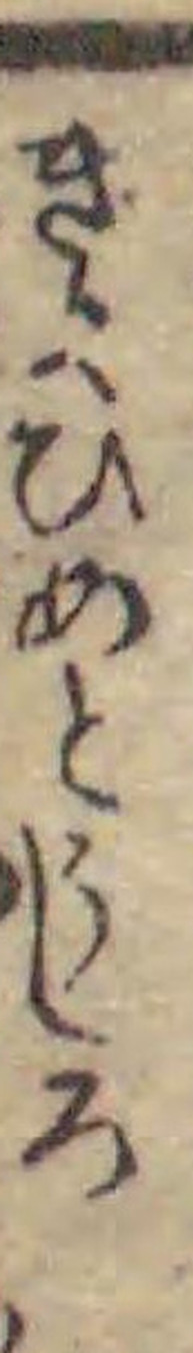きよひめとうしろ
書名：人心鏡写絵 : 3巻
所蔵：国立国会図書館 National Diet Library, JAPAN
